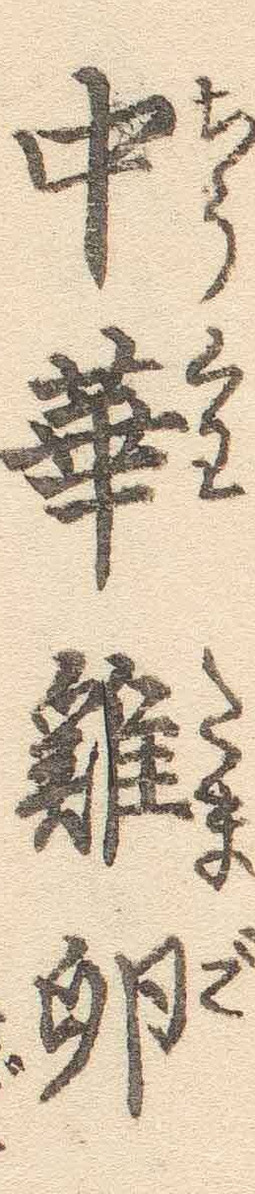中華鶏卵
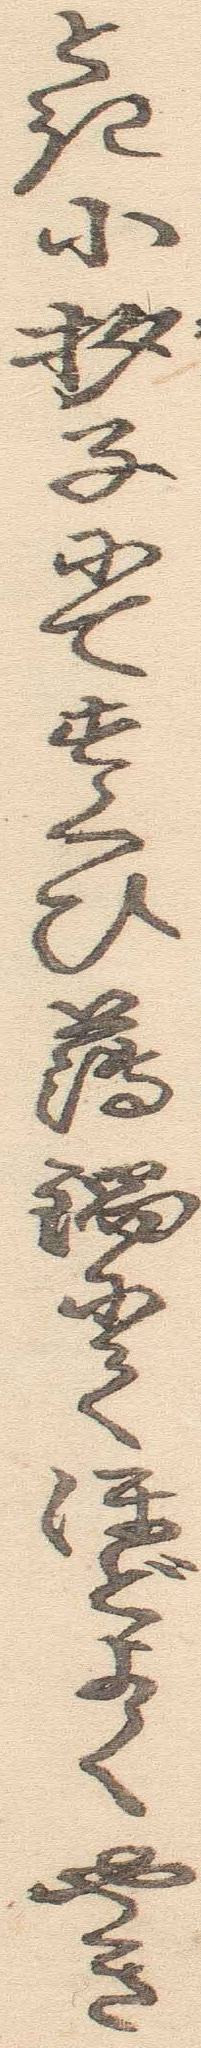とき小杓子にてすくひ薄鍋にてほどよくやき
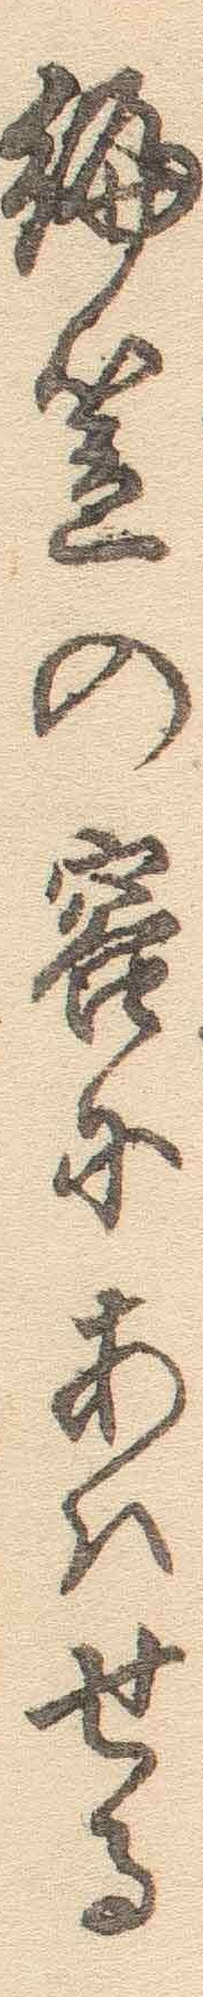編笠の容にあはせる
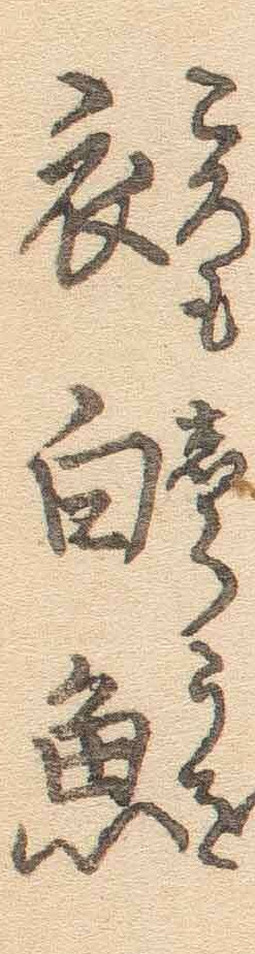衣白魚

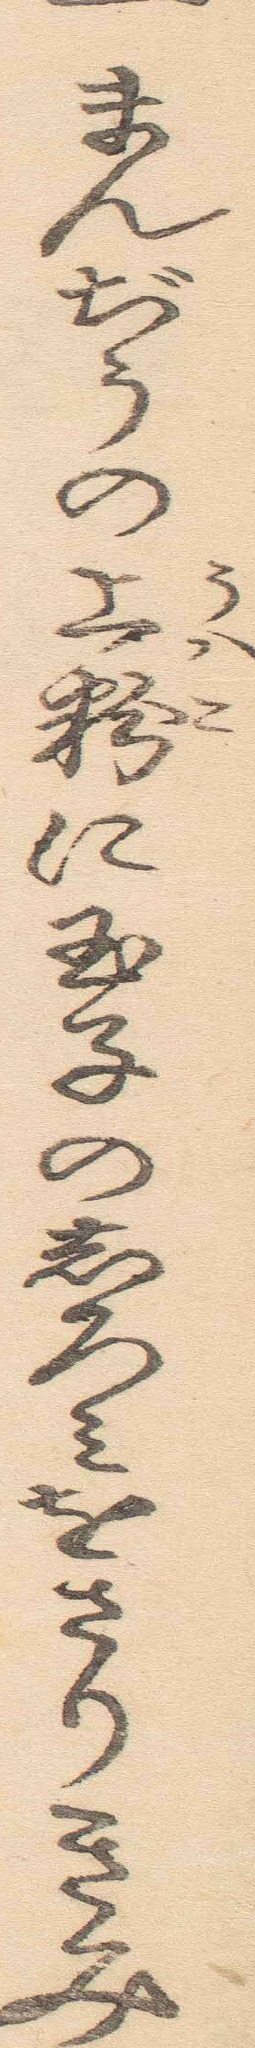一まんぢうの上粉に玉子のしろみをさりきみ
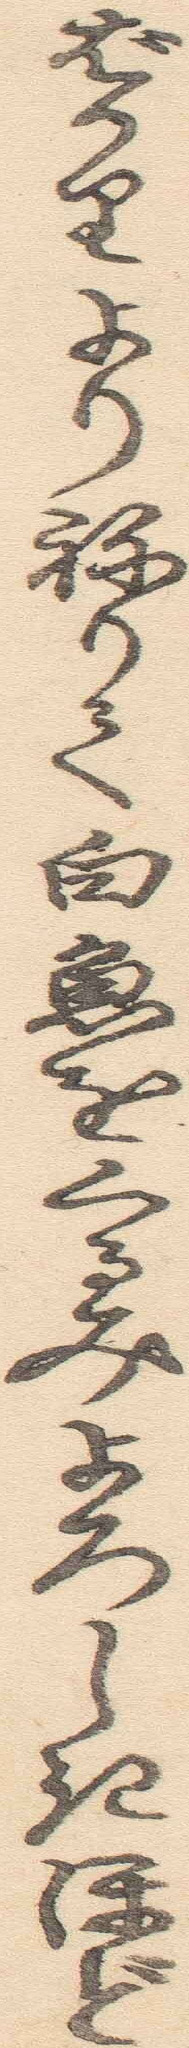ばかりよりねりて白魚をくるみよろしきほど
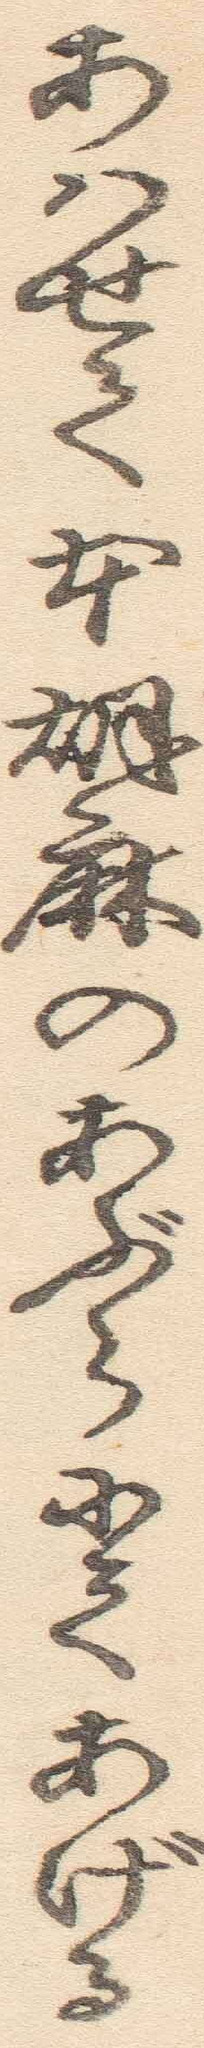あはせて本胡麻のあぶらにてあげる
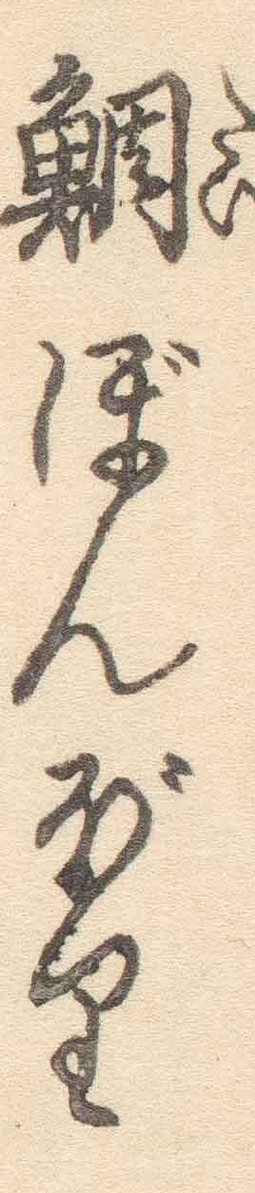鯛ぼんぼり
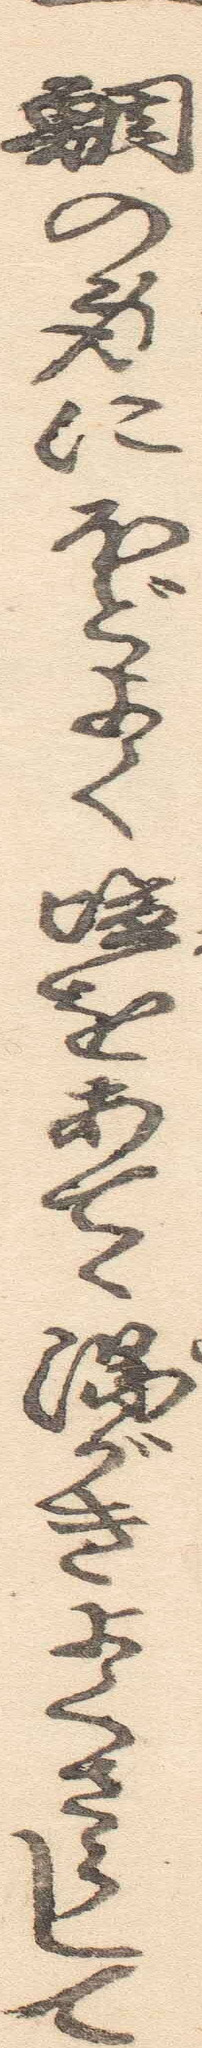一鯛の身にほどよく塩をあてゝ湯がきよくさらして
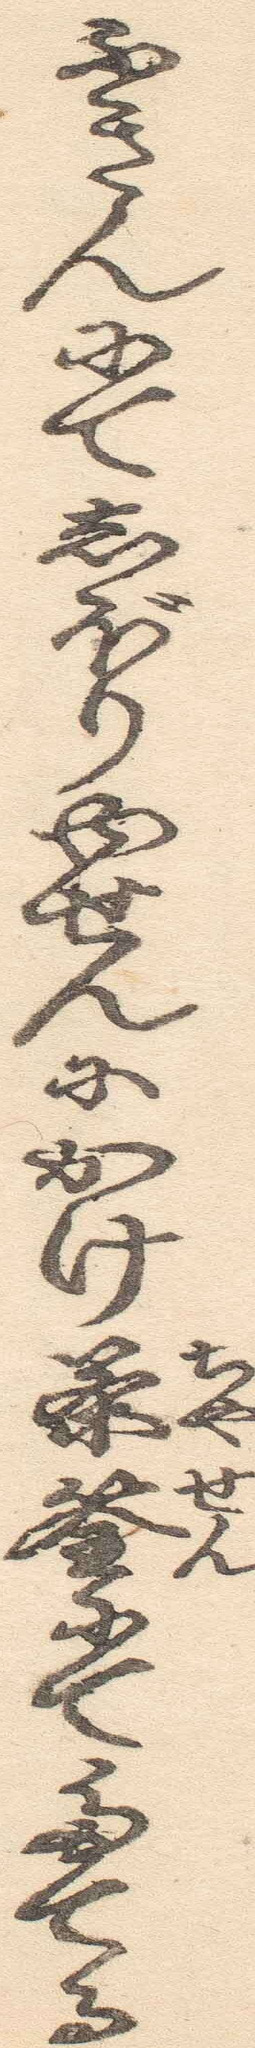ふきんにてしぼりゆせんにかけ茶筌にてたてる
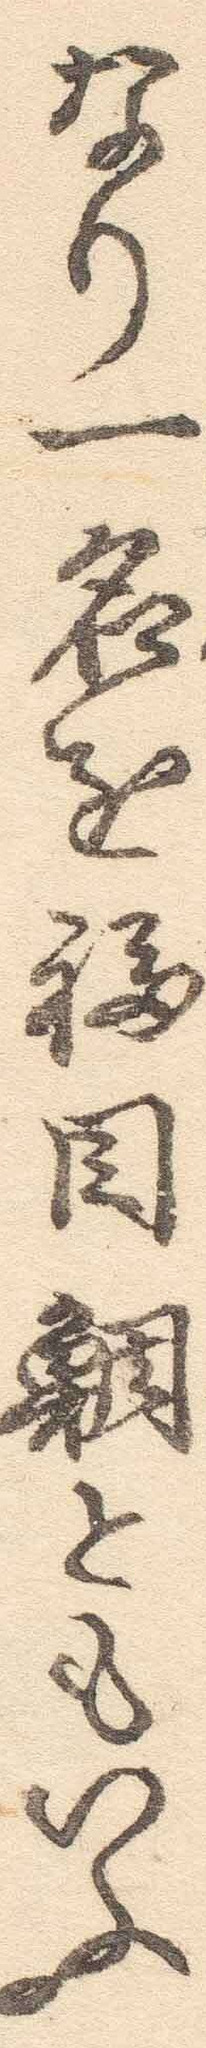なり一名を福目鯛ともいふ
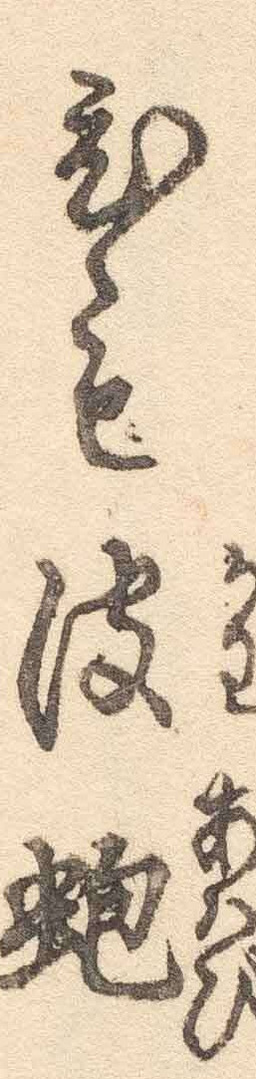ひも皮鮑
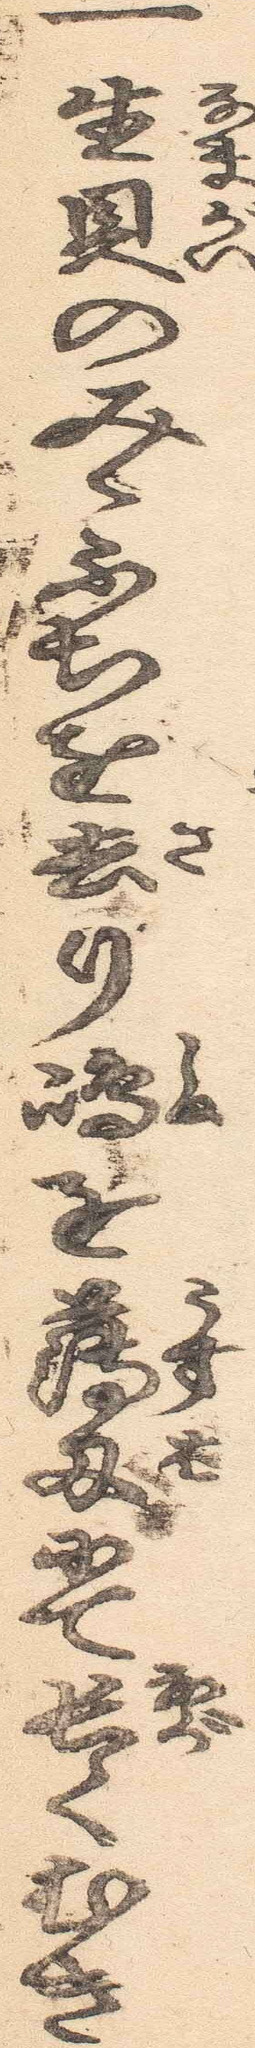一生貝のみゝふちを去り島を薄刃にて長くむき
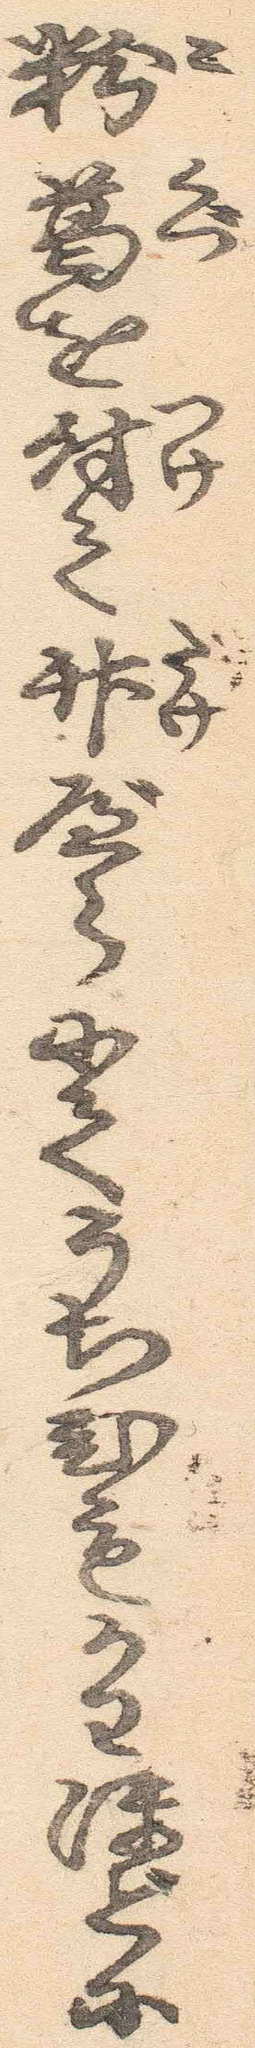粉葛を付て竹べらにてうちひもかわほどに
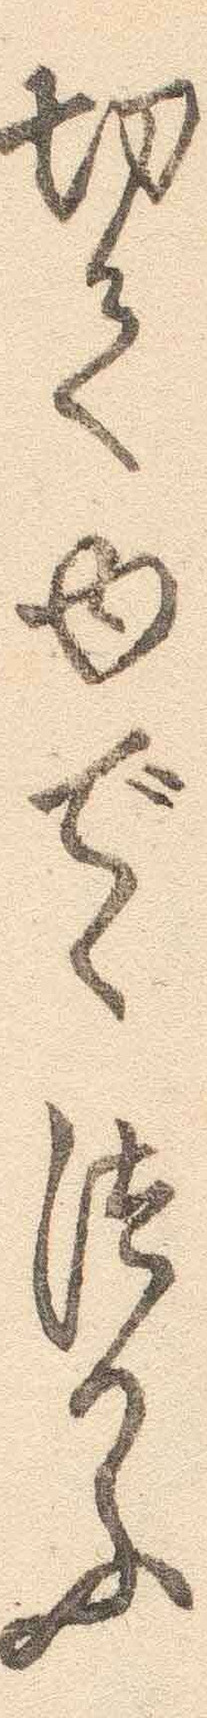切てゆでゝつかふ
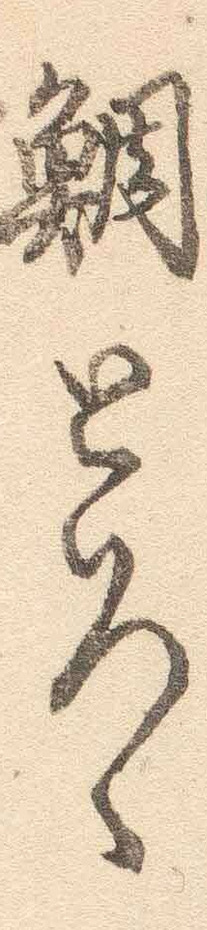鯛とろゝ
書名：料理通
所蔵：東京学芸大学附属図書館 国文学研究資料館
